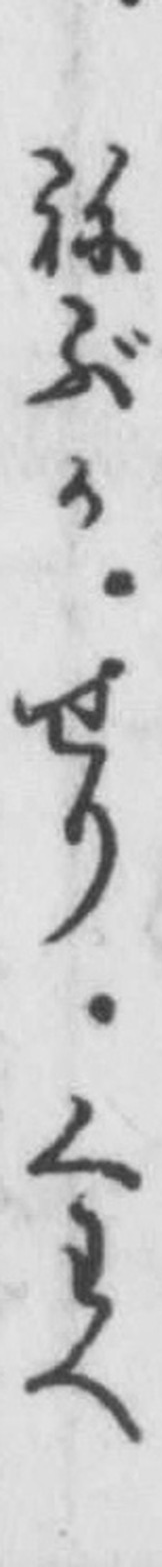ねぶかせりくわい
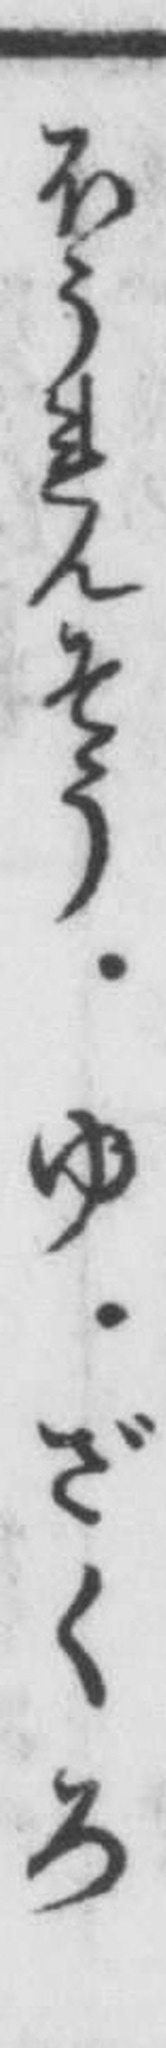ほうれんそうゆざくろ
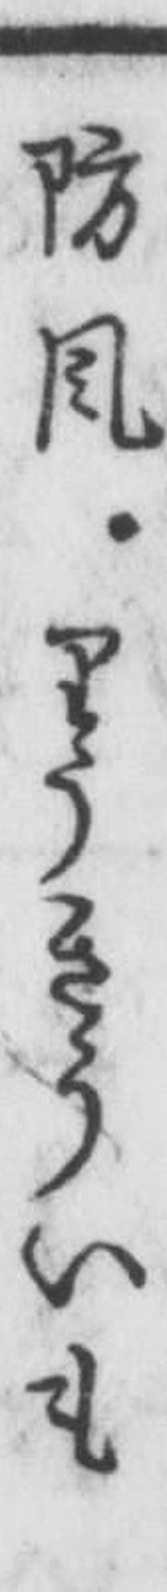防風りうきういも
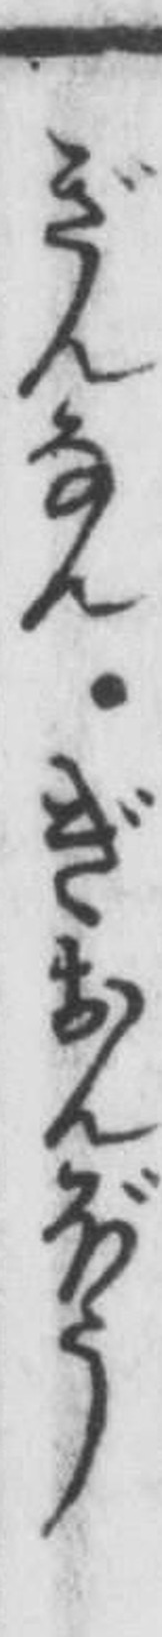ぎんなんぎおんぼう
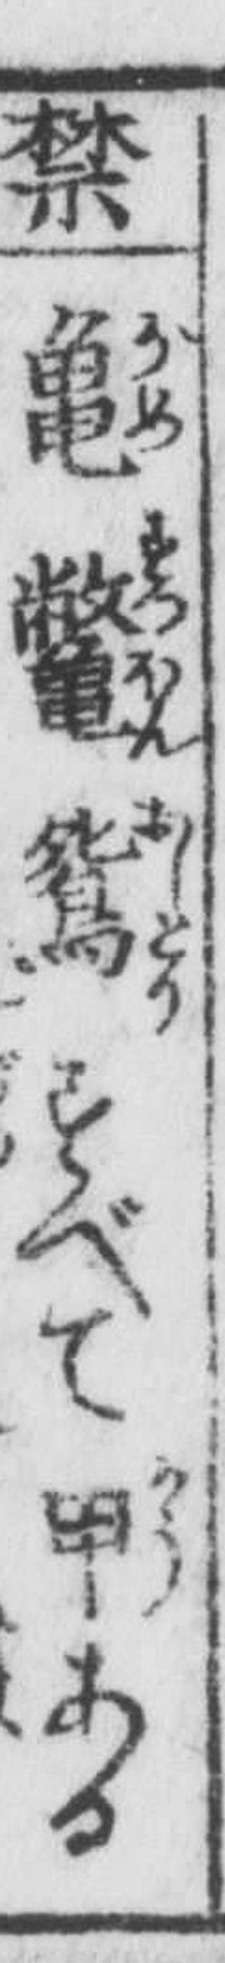禁亀鼈鴛すべて甲ある
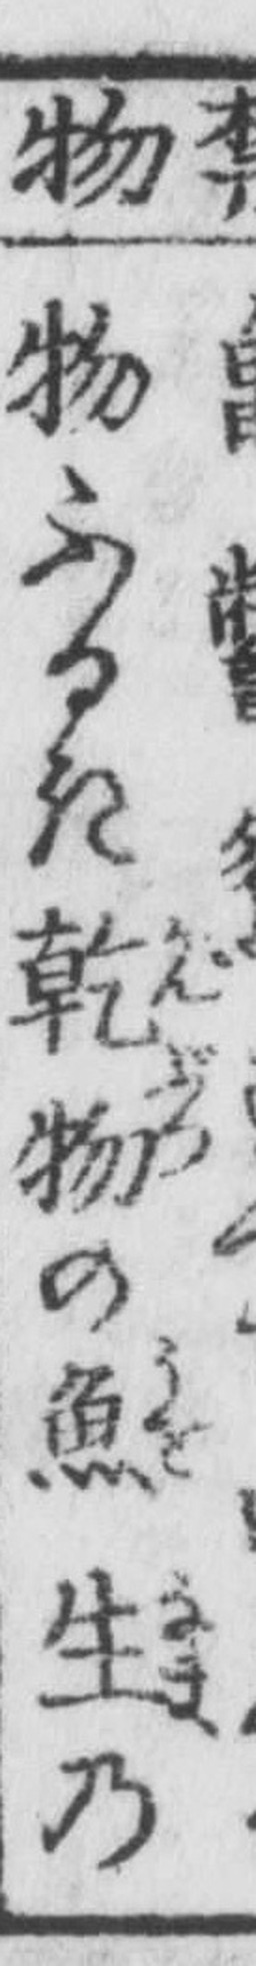物物ふるき干物の魚生の
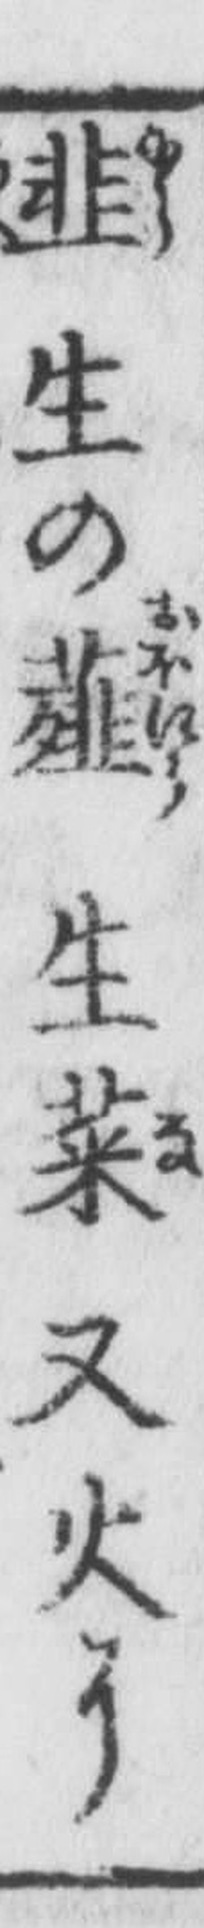韭生の韮生菜又火に
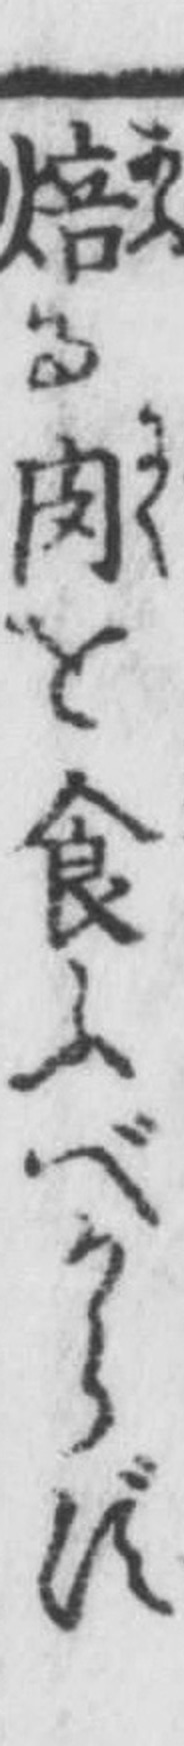焙る肉を食ふべからず
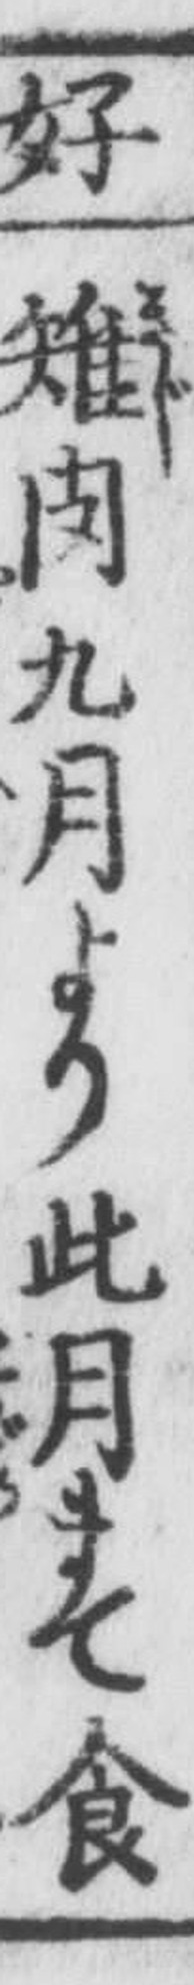好雉肉九月より此付きまて食
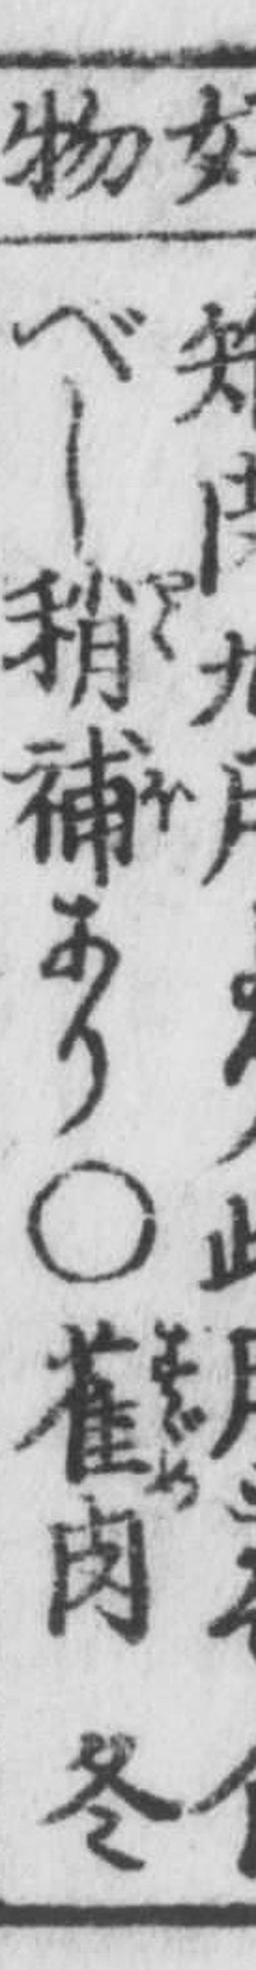物べし稍補あり〇萑肉冬
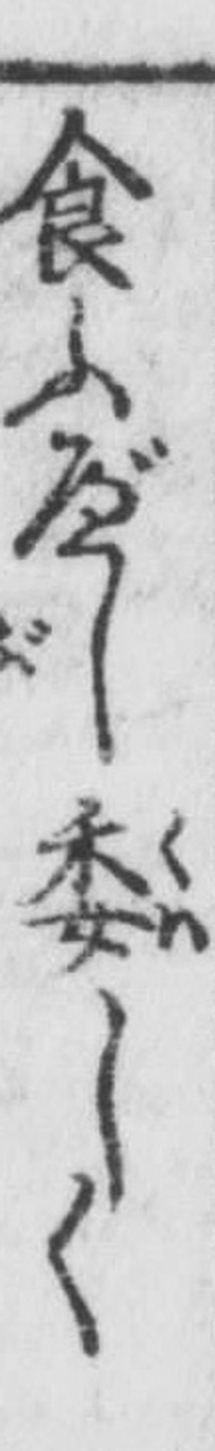食ふべし委しく
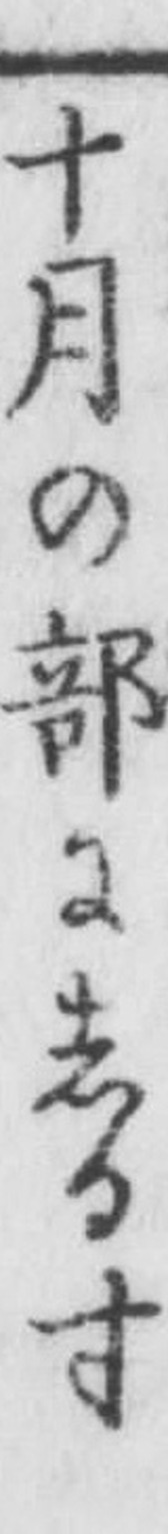十月の部にしるす
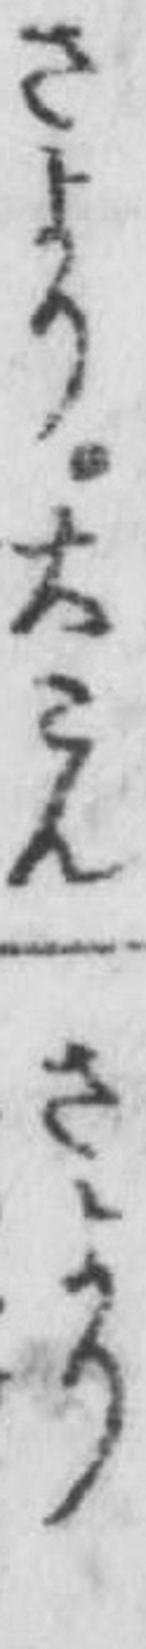膾さより大こんさより

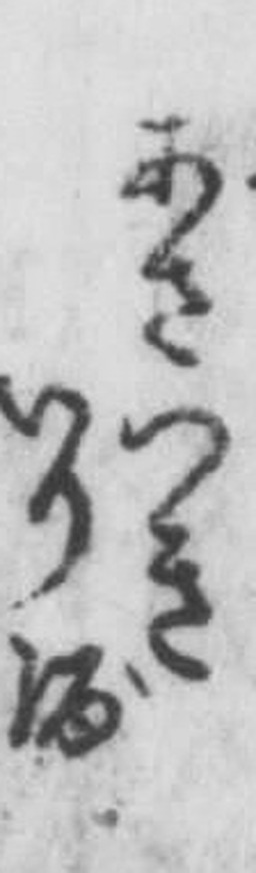いり酒
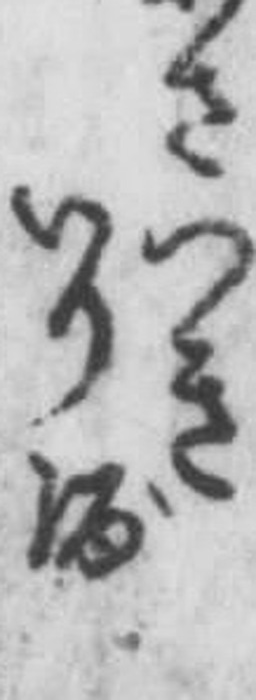いり酒
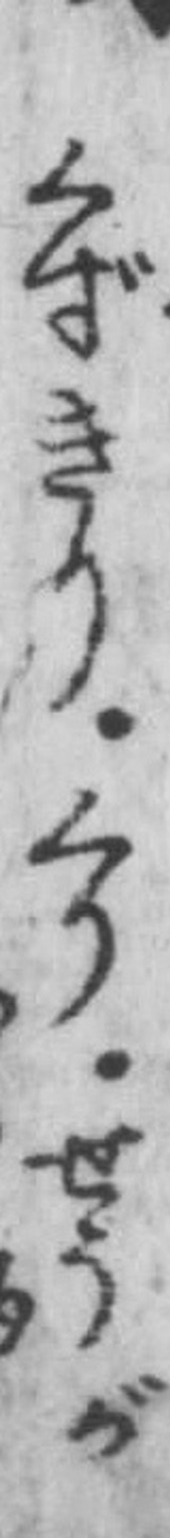差味くずきりくりせうが
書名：当世料理筌
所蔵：大阪府立大学学術情報センター 国文学研究資料館
